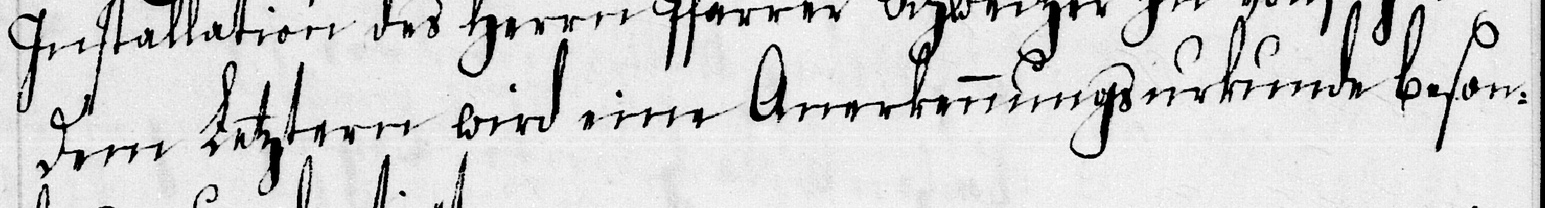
Dem Letztern wird eine Anerkennungsurkunde beson¬
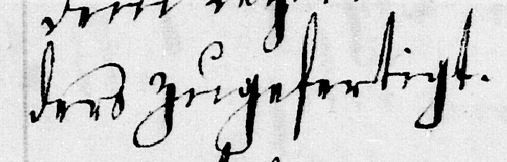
ders zugefertigt.
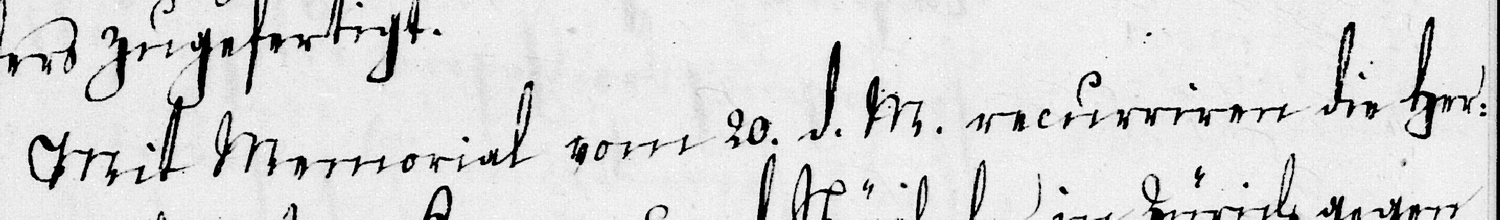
Mit Memorial vom 20. d. M. recurriren die Her¬
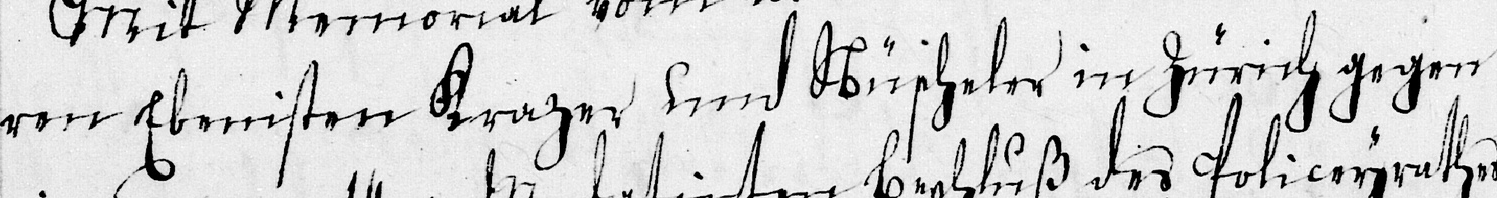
ren Ebenisten Krazer und Nüscheler in Zürich, gegen
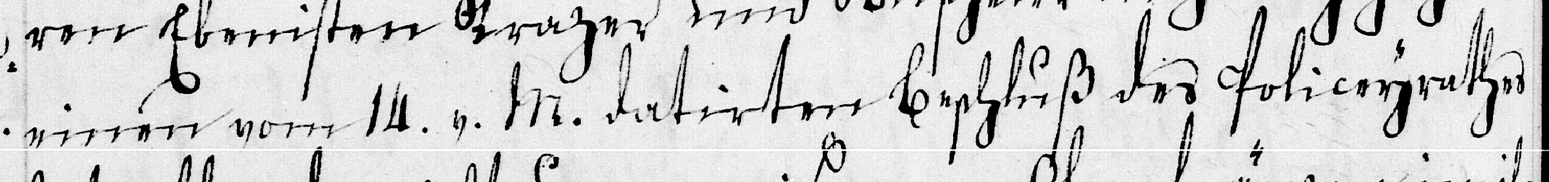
einen vom 14. v. M. datirten Beschluß des Policeyrathes
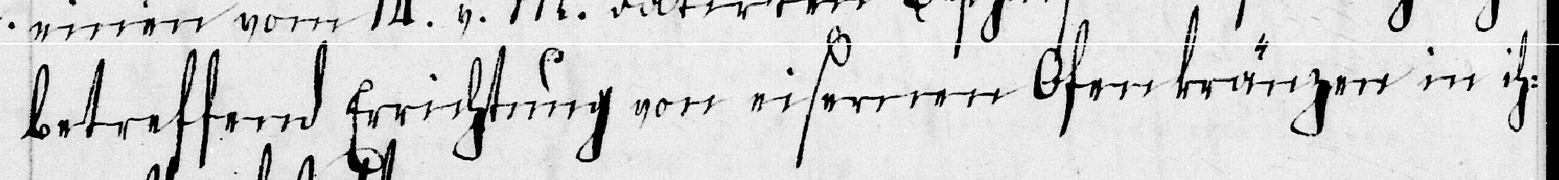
betreffend Einrichtung von eisernen Ofenkränzen in ih¬
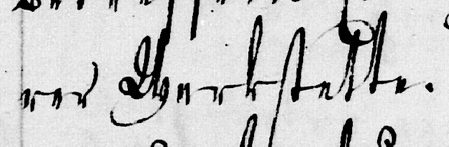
rer Werkstaette.
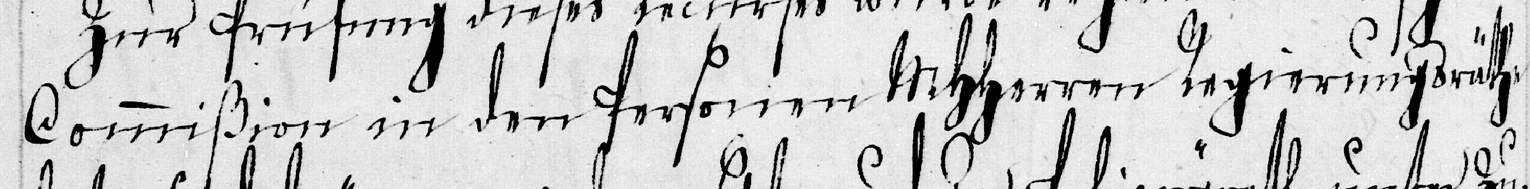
Commißion in den Personen MHHerren Regierungsräthe
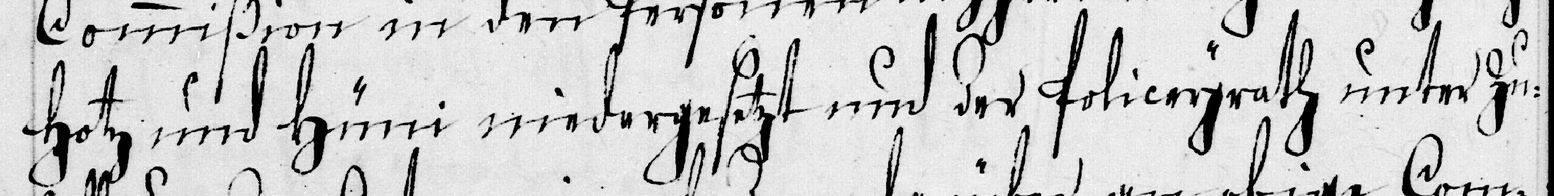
Hotz und Hüni niedergesetzt und der Policeyrath unter Zu¬
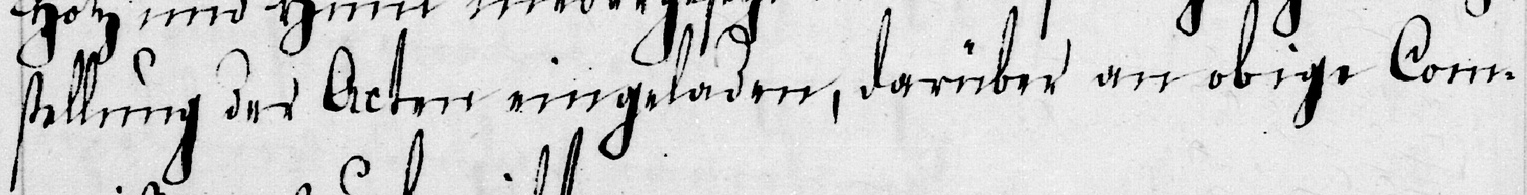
stellung der Acten eingeladen, darüber an obige Com¬
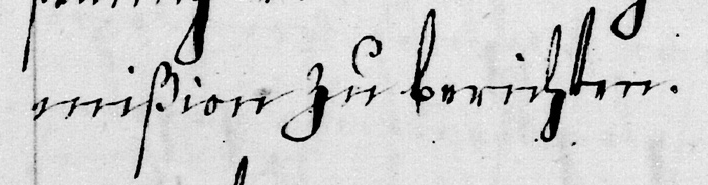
mißion zu berichten.
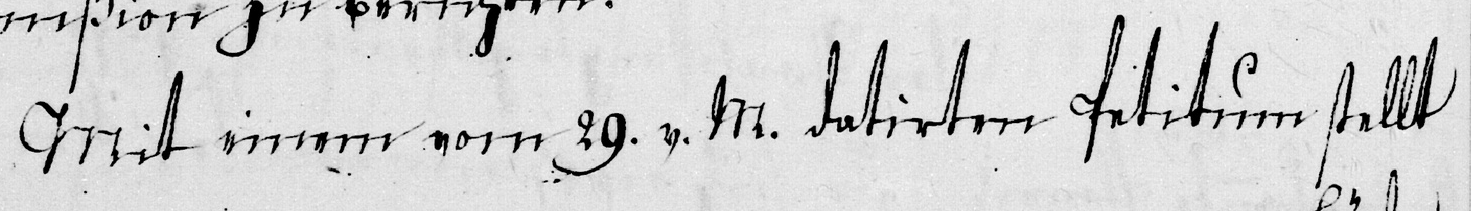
Mit einem vom 29. v. M. datirten Petitum stellt
